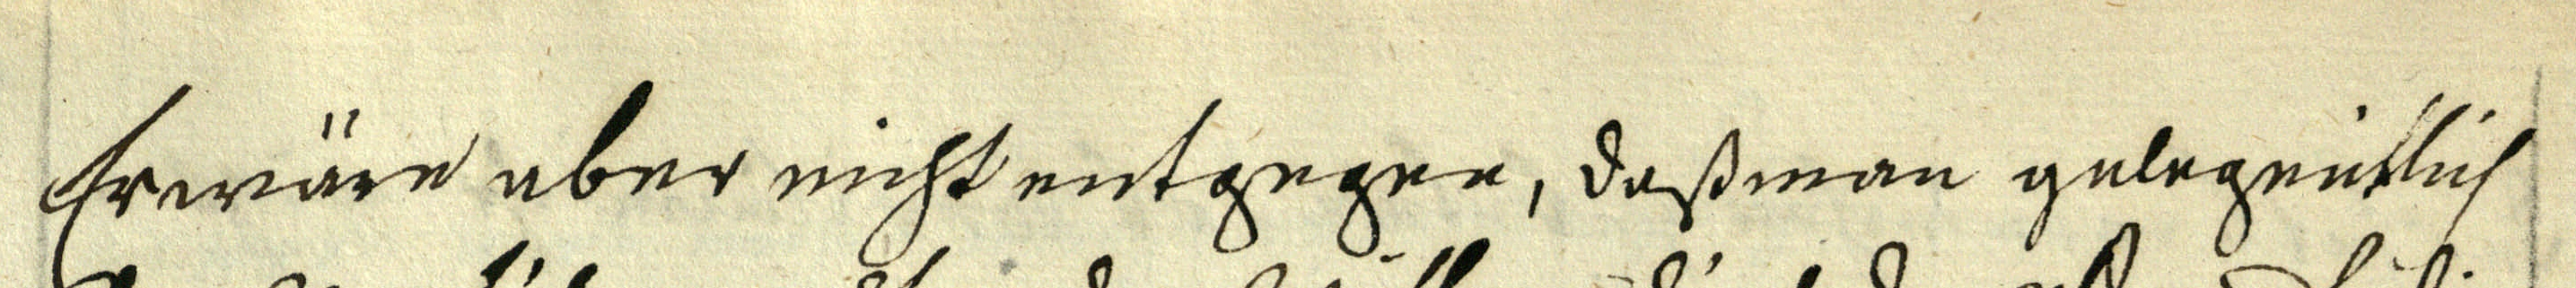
Er wäre aber nicht entgegen, daß man gelegentlich
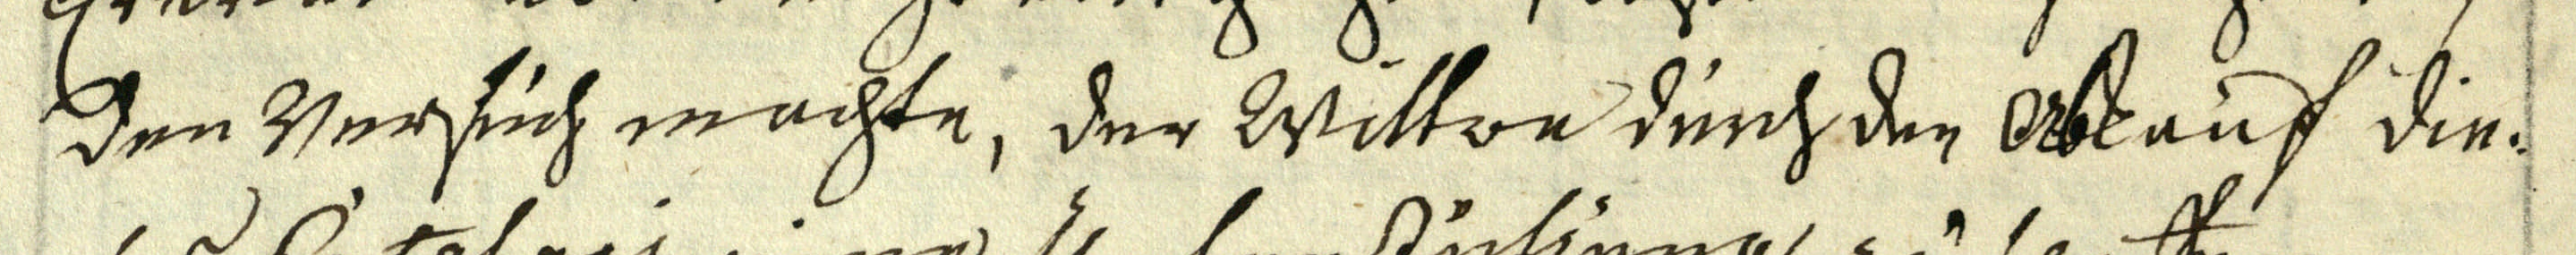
den Versuch machte, der Wittwe durch der Abkauf die¬
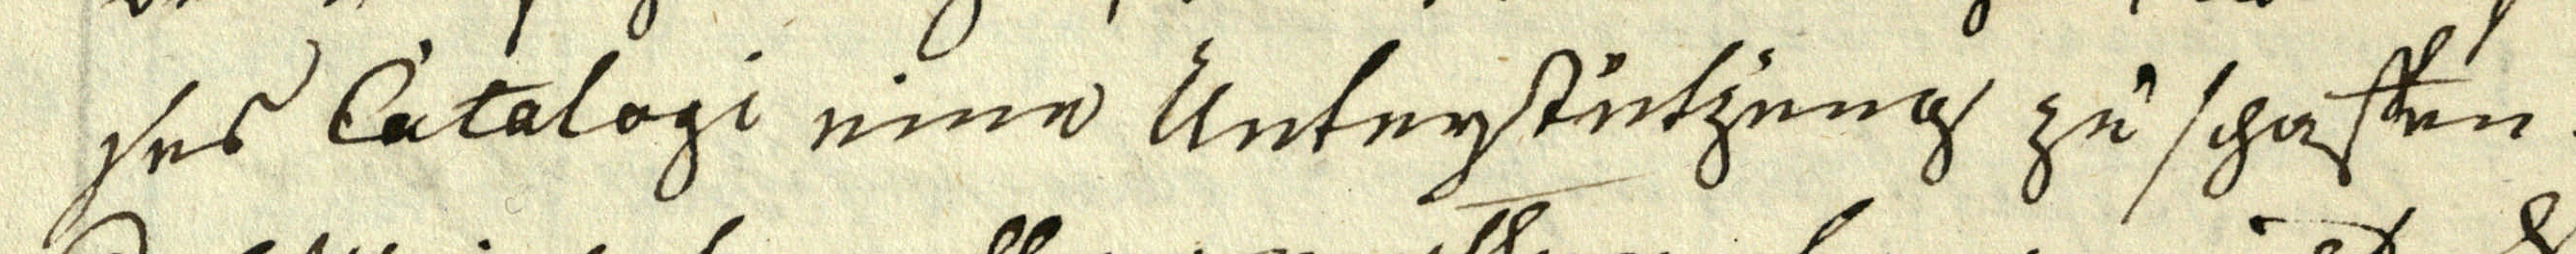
ses Catalogi eine Unterstützung zu schaffen.
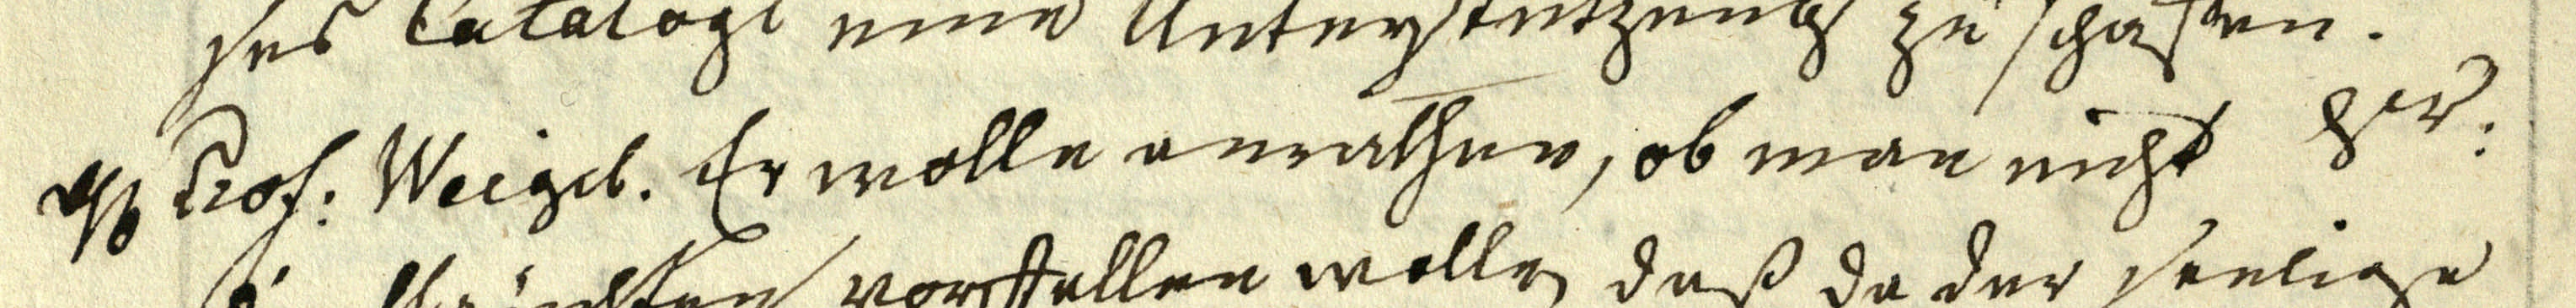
dh. Prof. Weigel. Er wolle anrathen, ob man nicht Sr
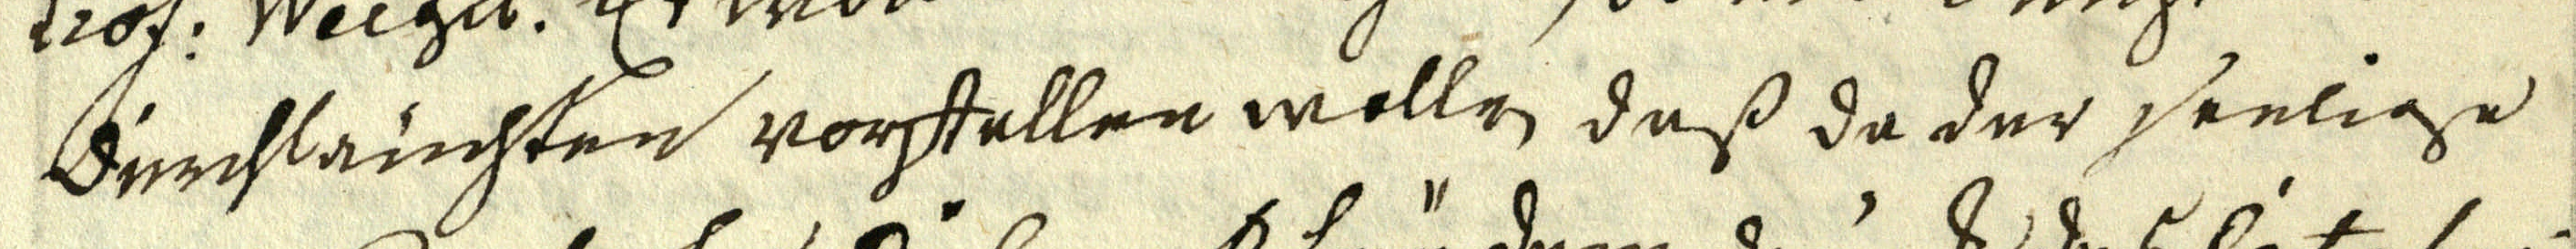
Durchlauchten vorstellen wolle, daß da der seelige
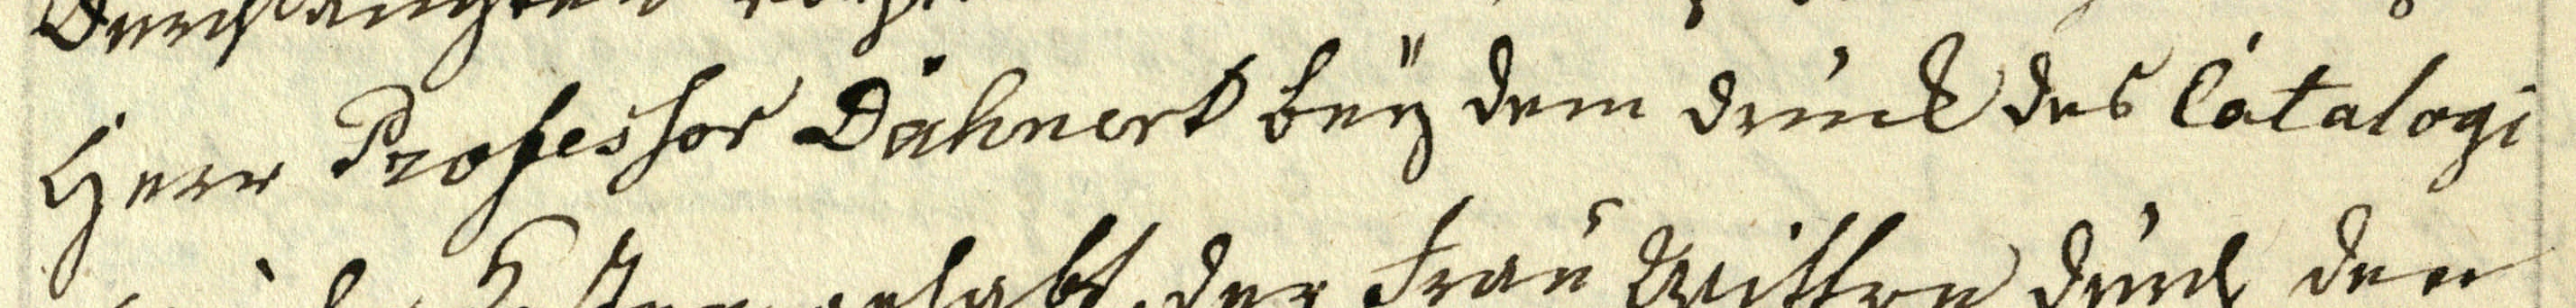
Herr Professor Dähnert beÿ dem Druck das Catalogi
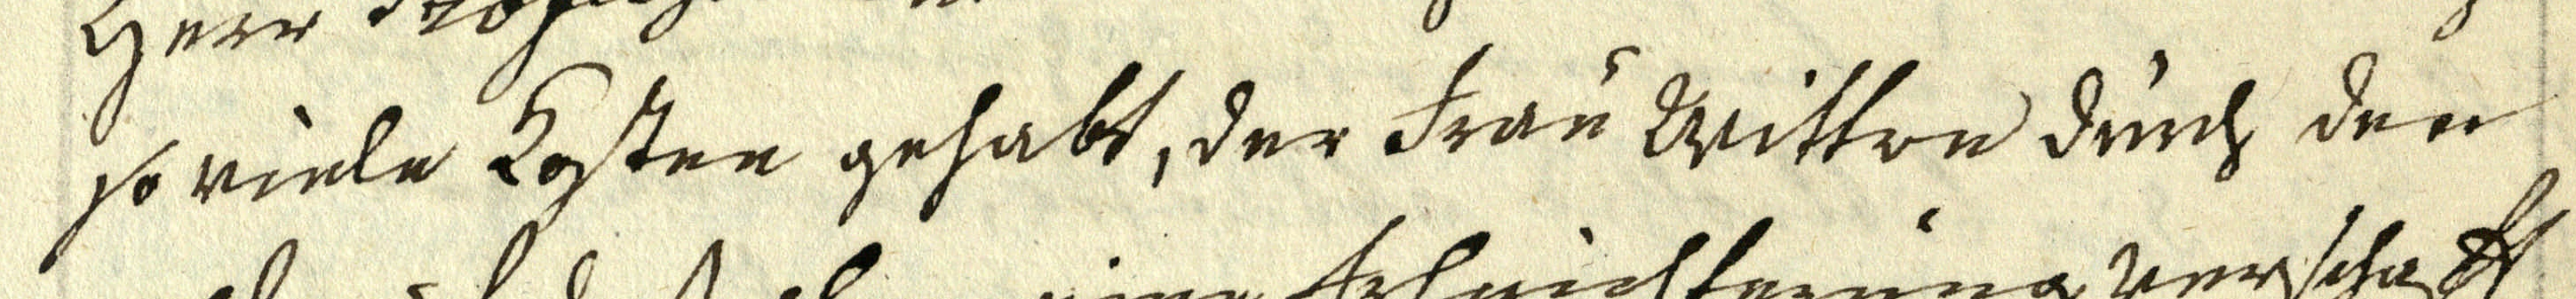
so viele Kosten gehabt, der Frau Wittwe durch den
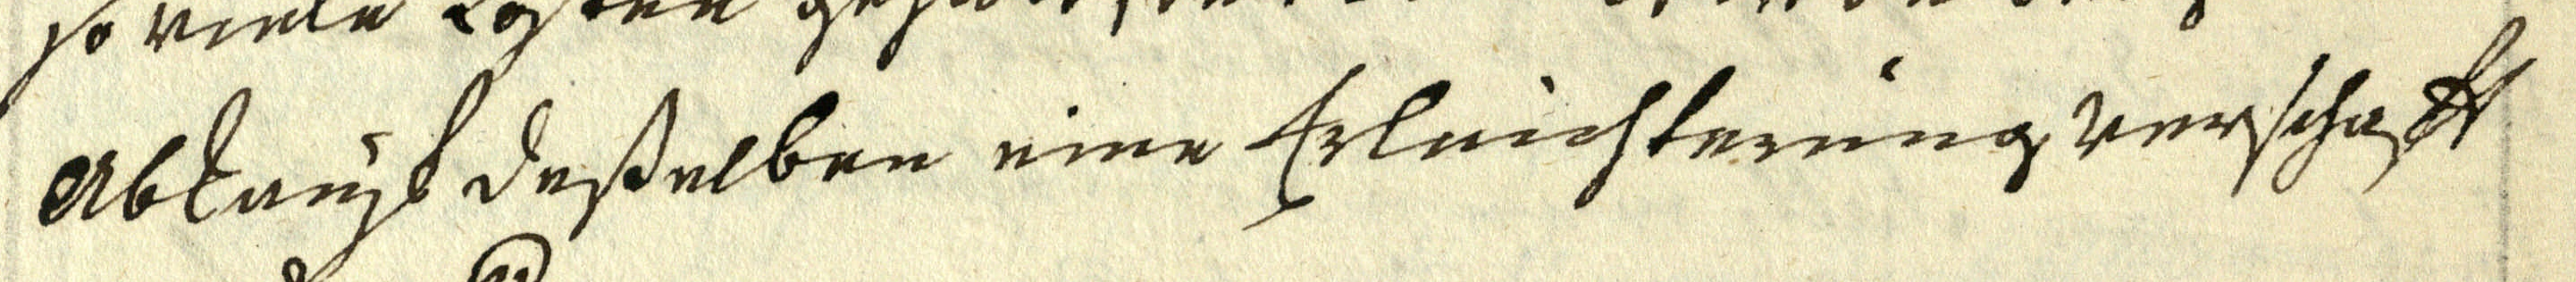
Abkauf deßelben eine Erleichterung verschaft
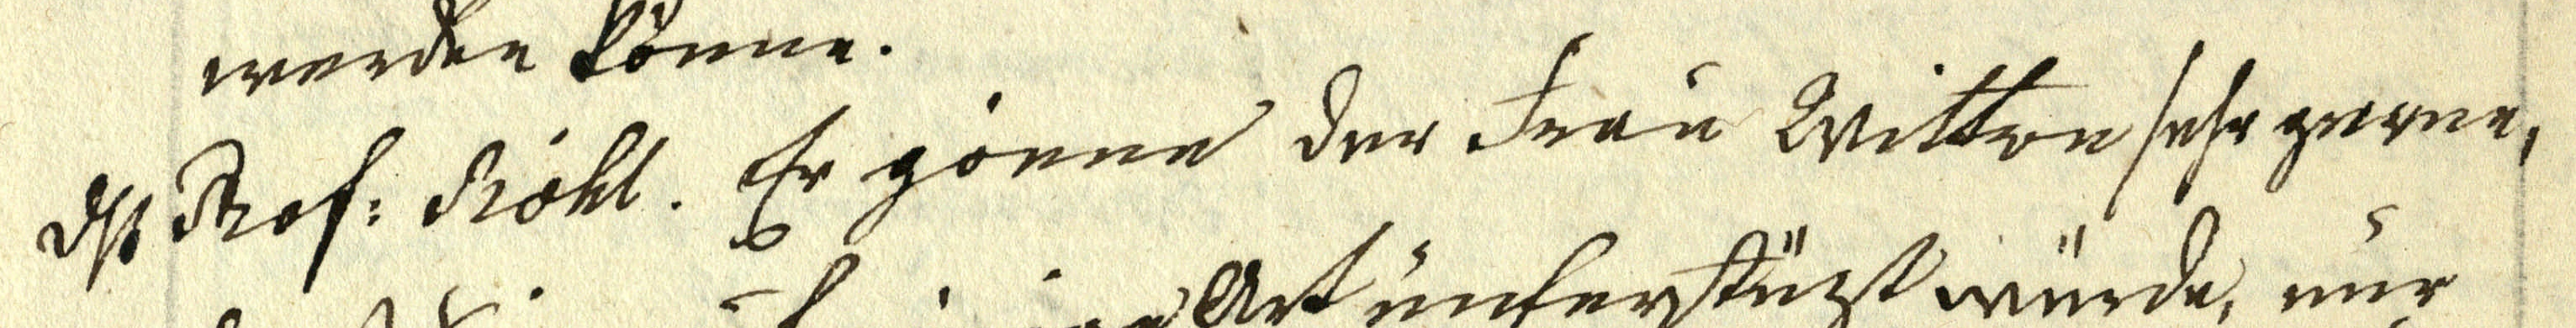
dh Prof. Röhl. Er gönne der Frau Wittwen sehr gerne,
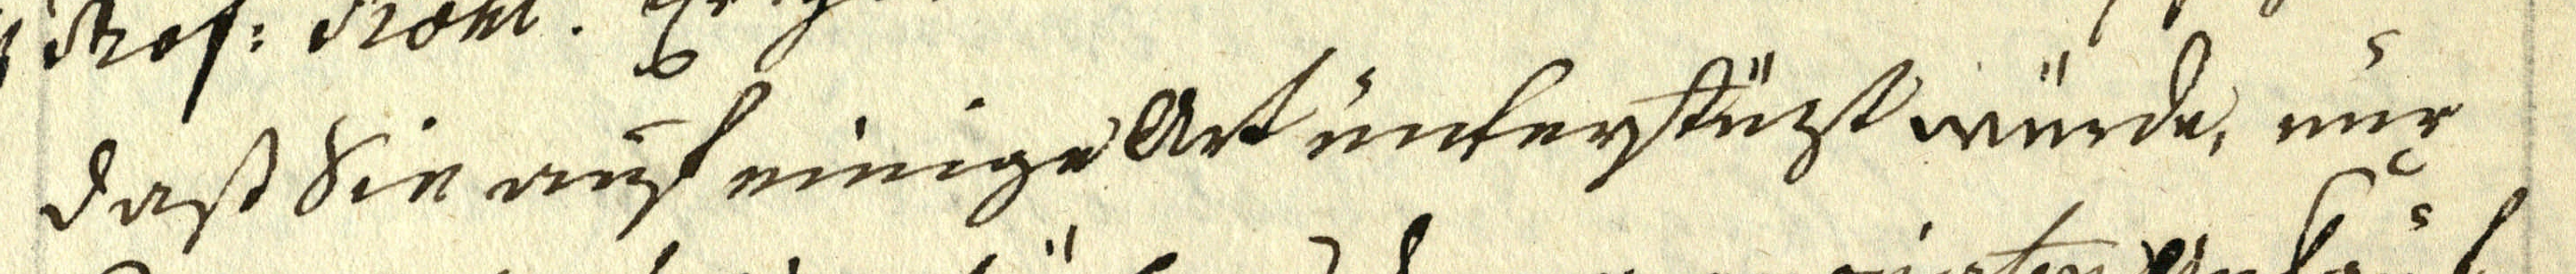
daß Sie auf einige Art unterstüzt würde, nur
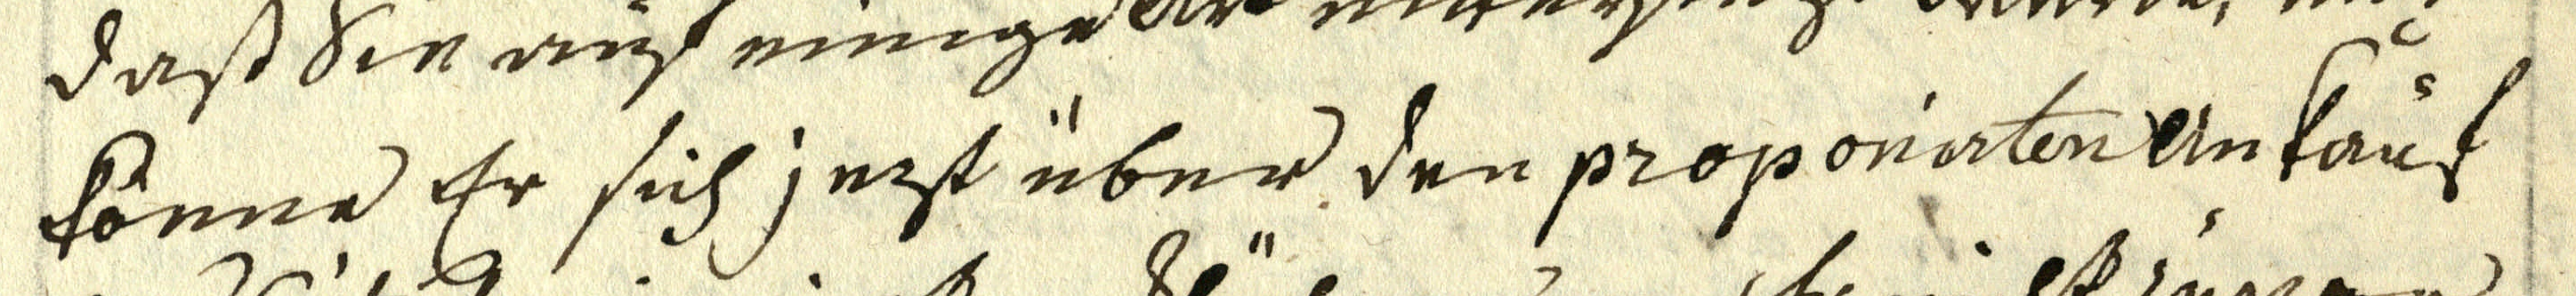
könne Er sich jezt über den proponirten Ankauf
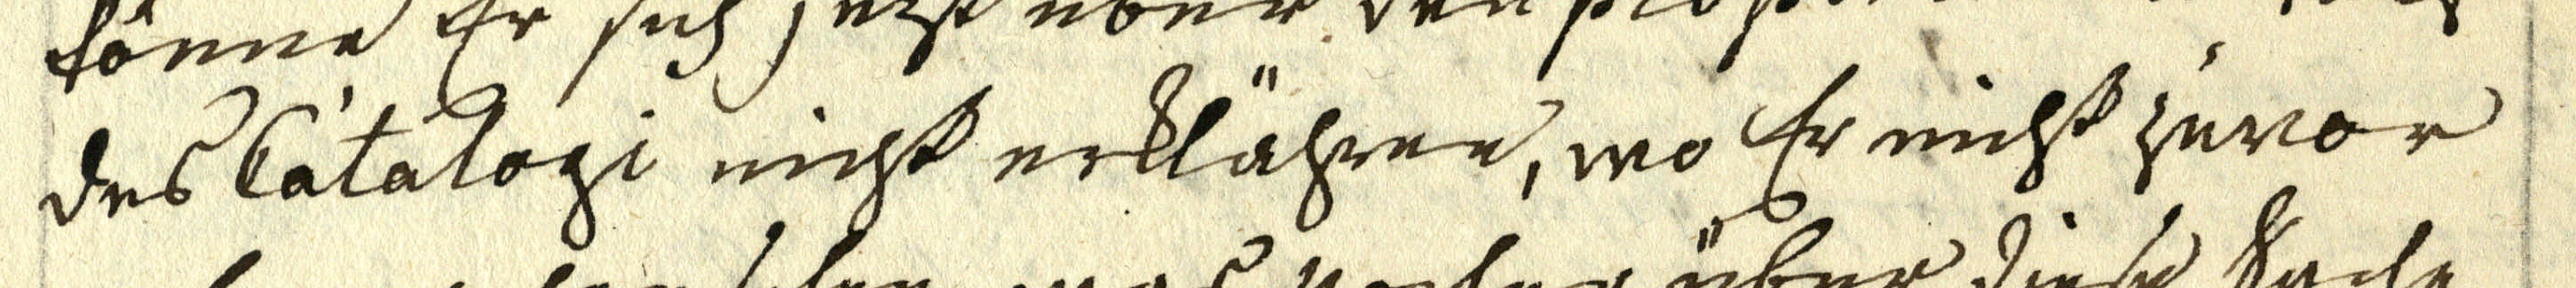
des Catalogi nicht erklähre, wo Er nicht zuvor
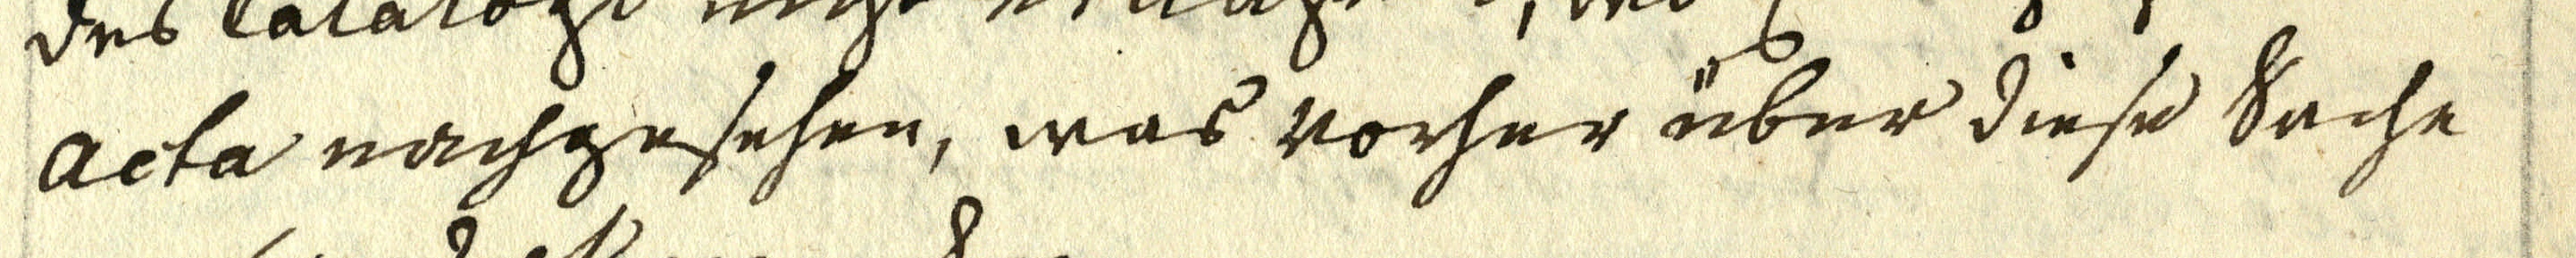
Acta nachgesehen, was vorher über diese Sache
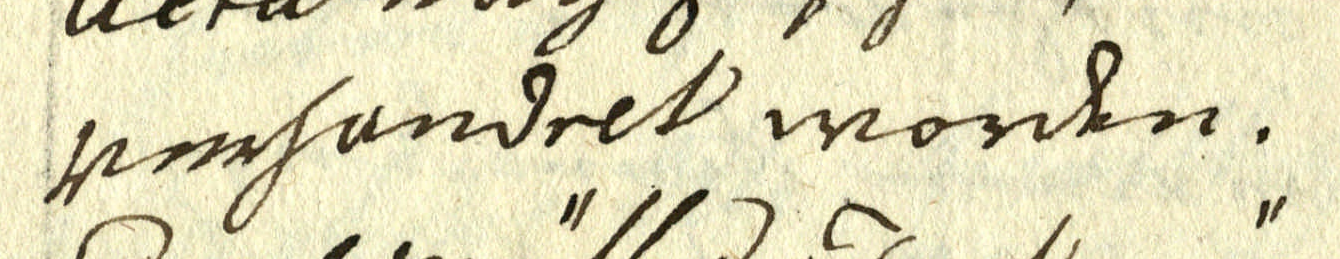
verhandelt worden.
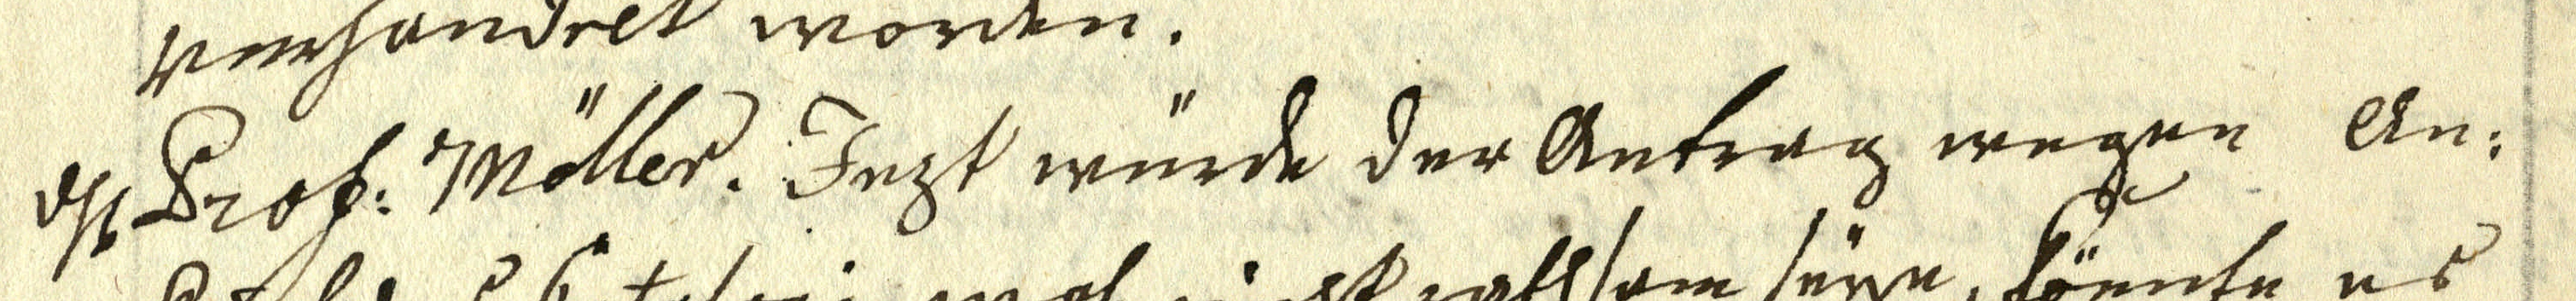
dh. Prof. Möller. Jezt würde der Antrag wegen An¬
